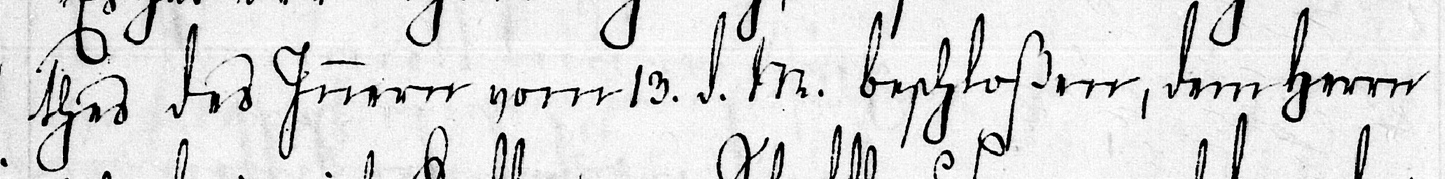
thes des Innern vom 13. d. M. beschloßen, dem Herrn
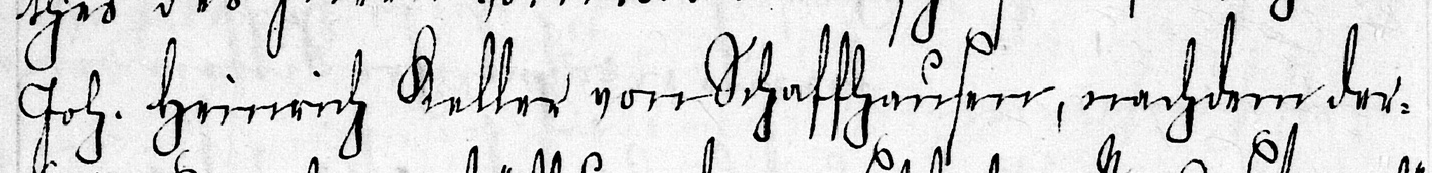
Joh. Heinrich Keller von Schaffhausen, nachdem ders¬
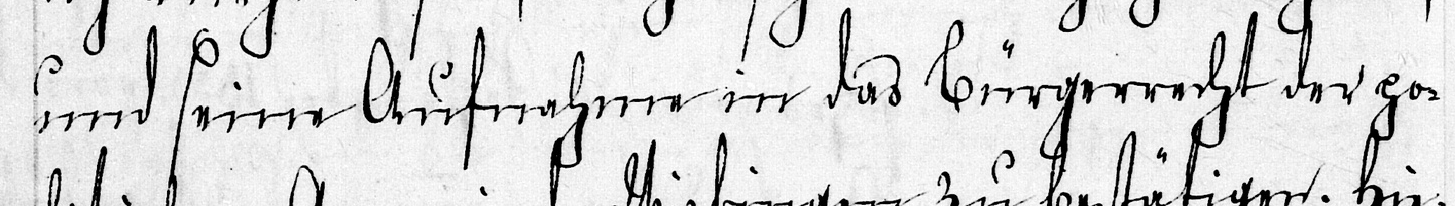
und seine Aufnahme in das Bürgerrecht der po¬
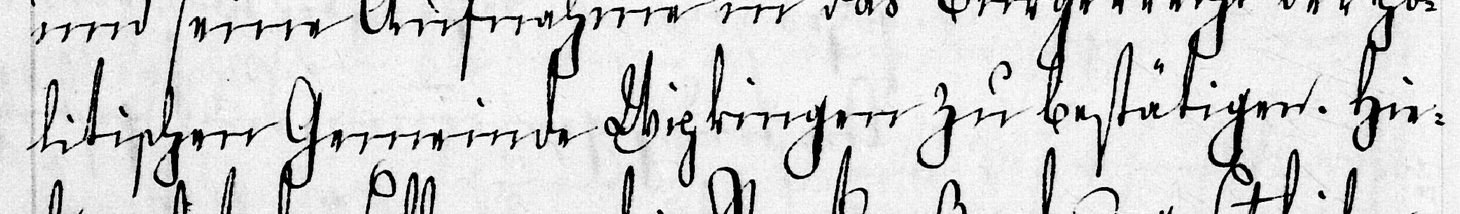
litischen Gemeinde Wipkingen zu bestätigen. Hie¬
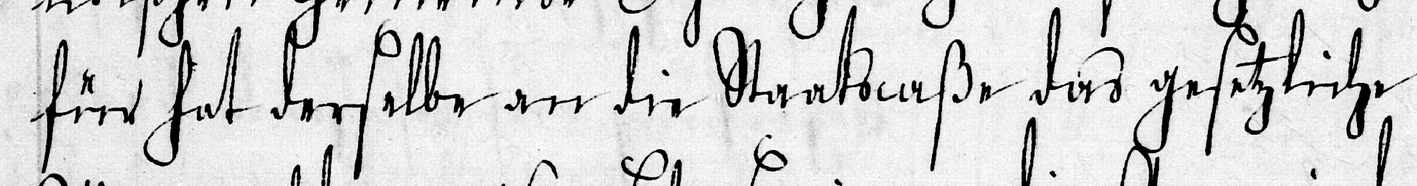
für hat derselbe an die Staatscaßa das gesetzliche
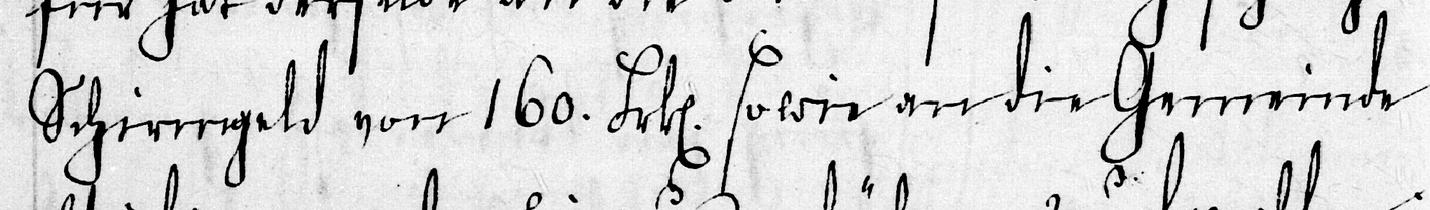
Schirmgeld von 160. Frk[en]. sowie an die Gemeinde
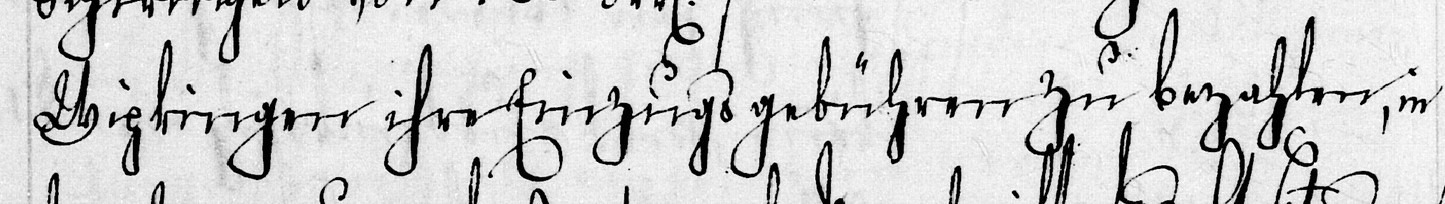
Wipkingen ihre Einzugsgebühren zu bezahlen, in
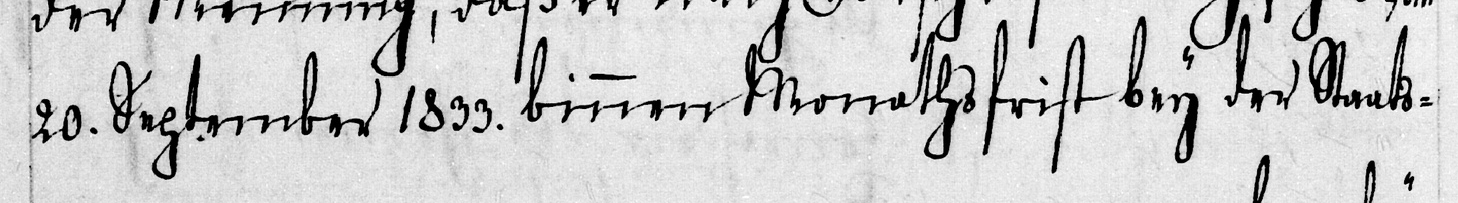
20. September 1833. binnen Monathsfrist bey der Staat¬
